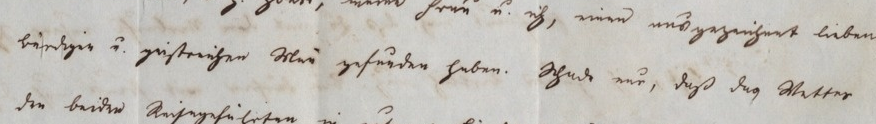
würdigen u. geistreichen Mann gefunden haben. Schade nur, daß das Wetter
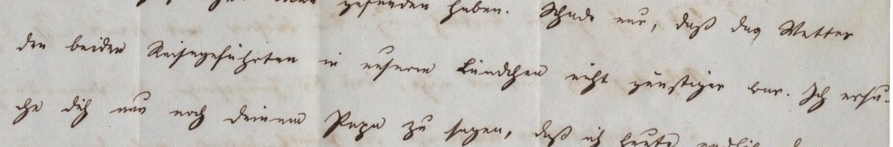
den beiden Reisegefährten in unserm Ländchen nicht günstiger war. Ich ersu-
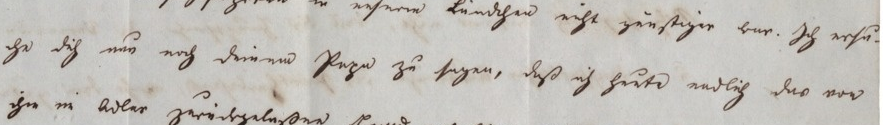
che Dich nur noch Deinem Papa zu sagen, daß ich heute endlich das von
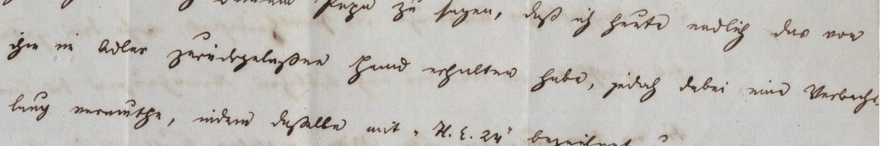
ihm im Adler zurückgelaßne Hemd erhalten habe, jedoch dabei eine Verwechs-
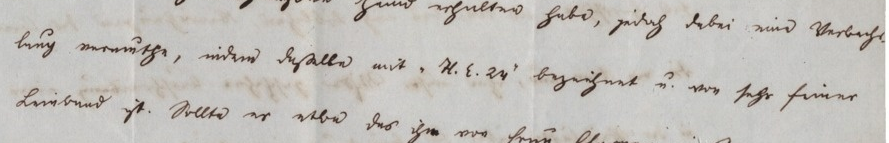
lung vermuthe, indem dasselbe mit «H. E. 24» bezeichnet u. von sehr feiner
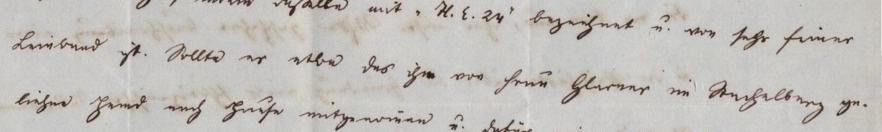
Leinwand ist. Sollte er etwa das ihm von Frau Glarner im Stachelberg ge-
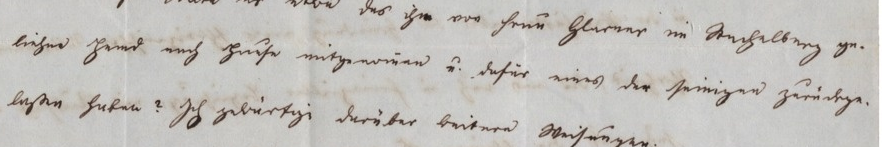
liehne Hemd nach Hause mitgenommen u. dafür eines der seinigen zurückge-
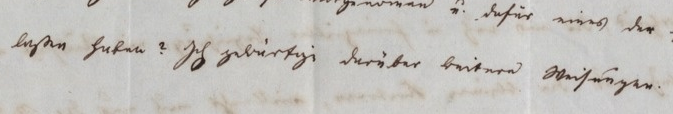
lassen haben? Ich gewärtige darüber weitere Weisungen.
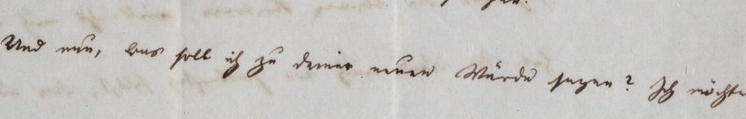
Und nun, was soll ich zu Deiner neuen Würde sagen? Ich möchte
